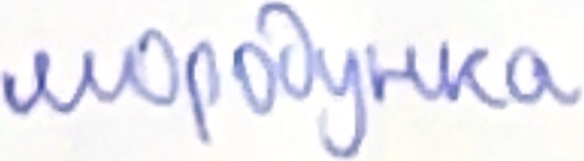мородунка
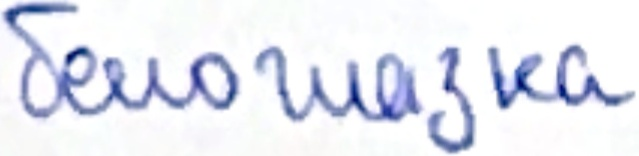белоглазка
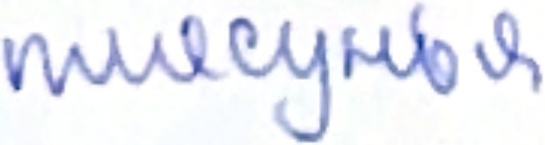плясунья
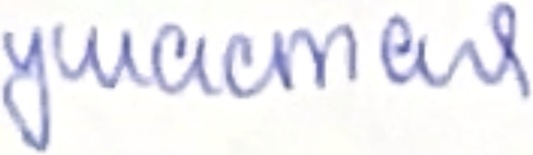ушастая
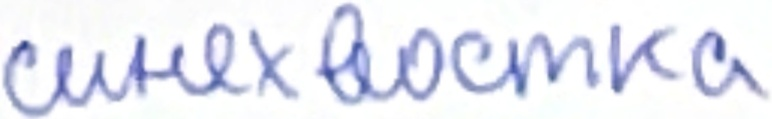синехвостка
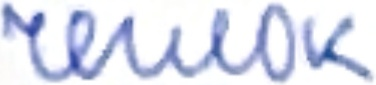чеглок
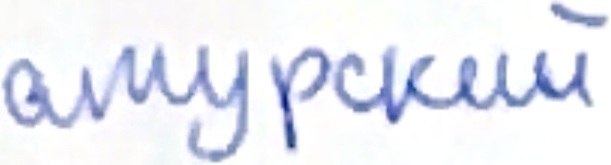амурский
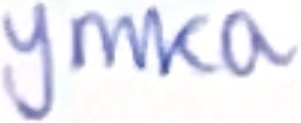утка
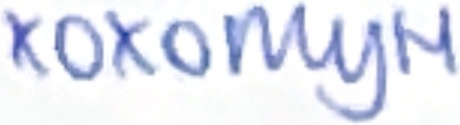хохотун
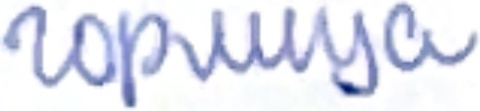горлица
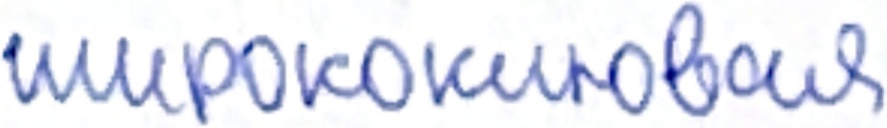ширококлювая
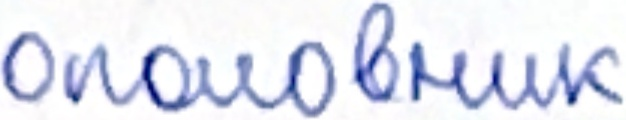ополовник
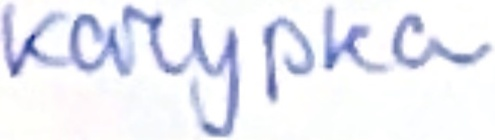качурка
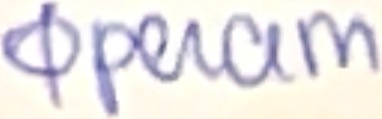фрегат
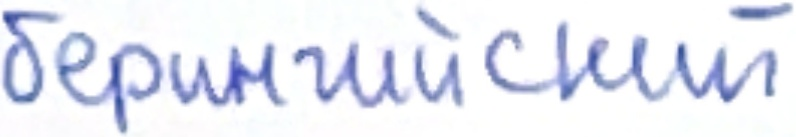берингийский
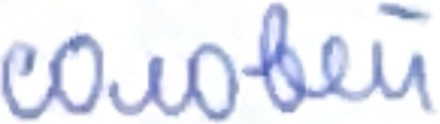соловей
